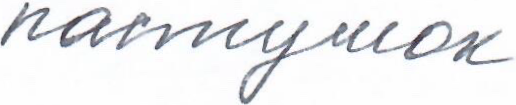пастушок
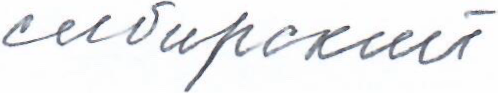сибирский
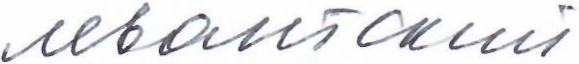левантский
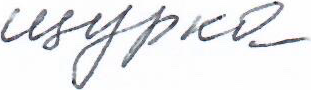щурка
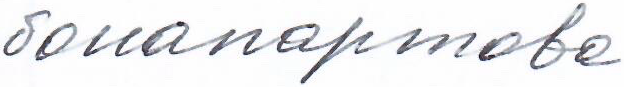бонапартова
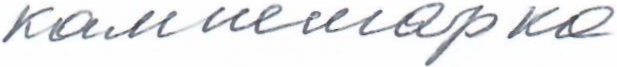камнешарка
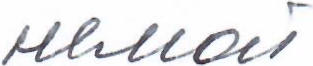немой
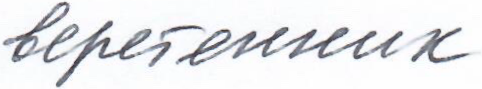веретенник
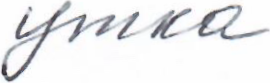утка
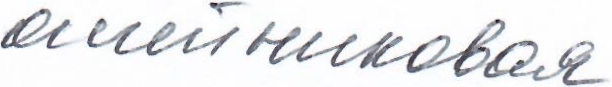ошейниковая
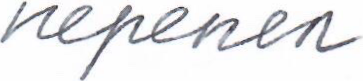перепел
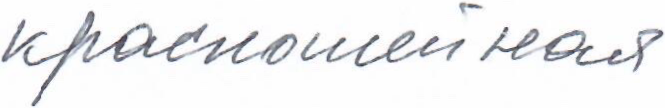красношейная
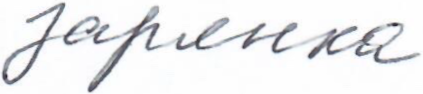зарянка
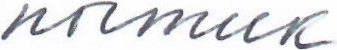пыжик
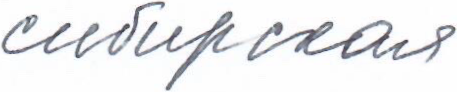сибирская
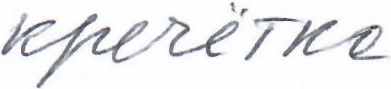кречётка
